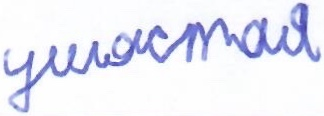ушастая
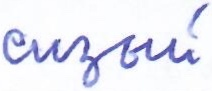сизый
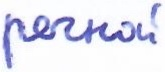речной
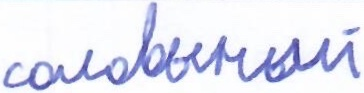соловыный
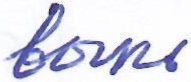выпь
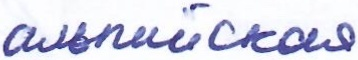альпийская
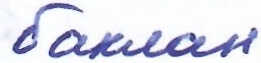баклан
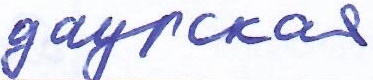даурская
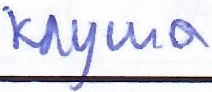клуша
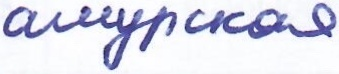амурская
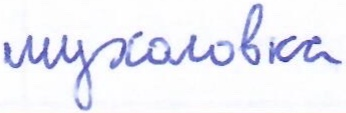мухоловка
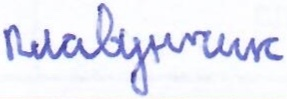плавунчик
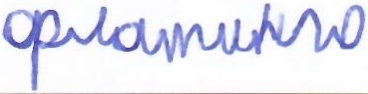фламинго
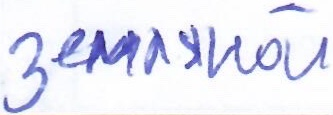земляной
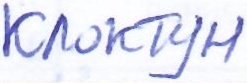клоктун
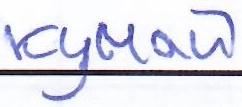кумай
